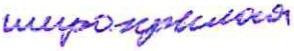ширококрылая
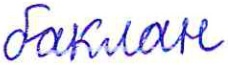баклан
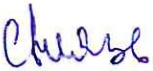свиязь
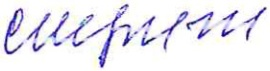стриж
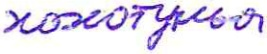хохотунья
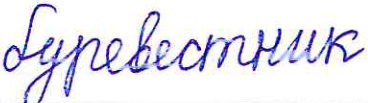буревестник
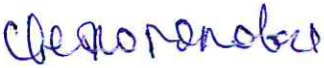светлоголовая
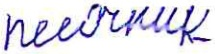песочник
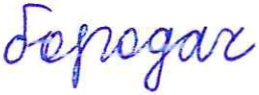бородач
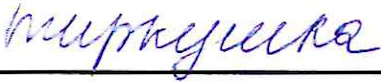тиркушка
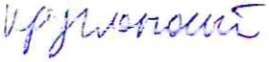круглоносый
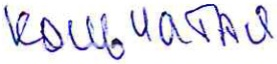кольчатая
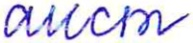аист
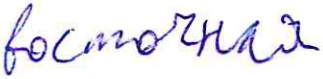восточная
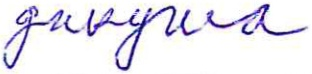дикуша
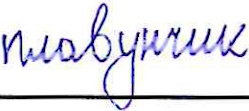плавунчик
